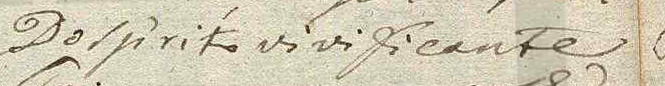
Do Sp̄rito vivificante
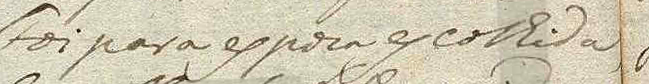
Foi para espoza escolhida,
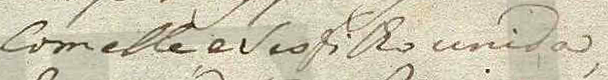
Com elle e Seo filho unida,
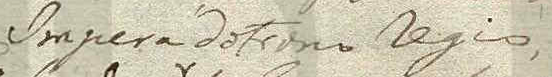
Impera do trono Regio,
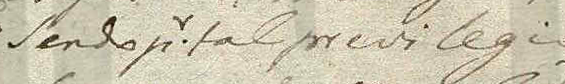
Sendo p.r tal previlegio,
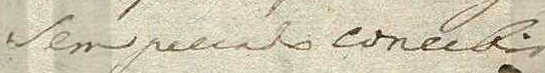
Sem peccado concebida
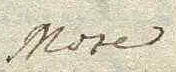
Mote
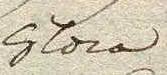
Gloza
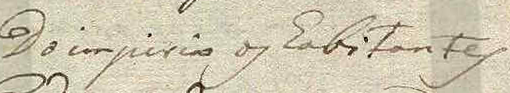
Do impirio os habitantes
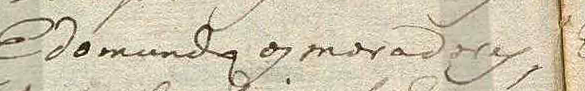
E do mundo os moradores,
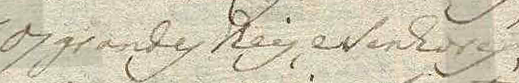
Os grandes Reis, e Senhores,
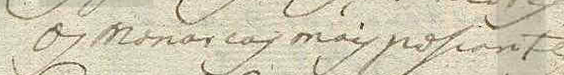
Os monarcas mais possantes
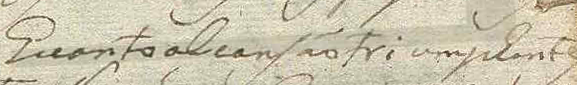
Quanto alcansaõ triumphantes
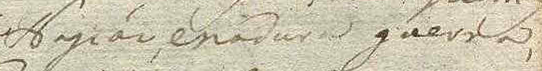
Na páz, e na dura guerra,
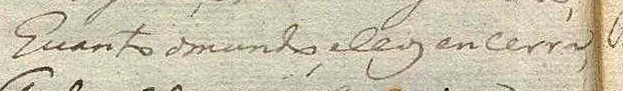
Quanto o mundo, e Ceos encerra,
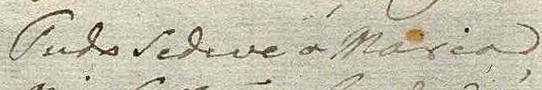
Tudo se deve a Maria,
